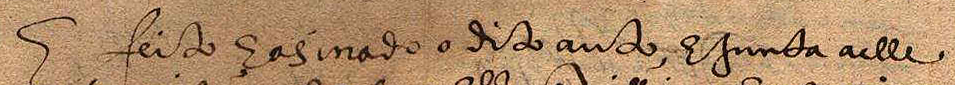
E feito E asinado o dito auto, E Junta a elle
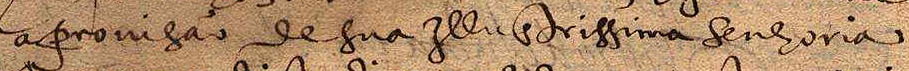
a prouisaõ de sua Jllustrissima Senhoria
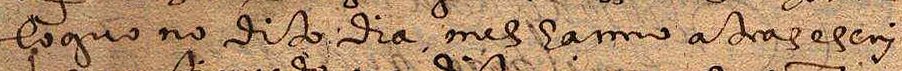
loguo no dito dia, mes E anno atras escrj
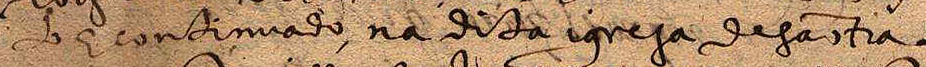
to E continuado, na dita igreja de são tia
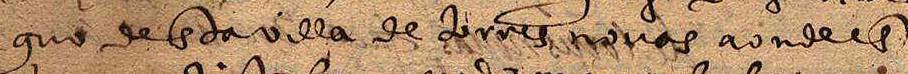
guo desta villa de torres nouas aonde es
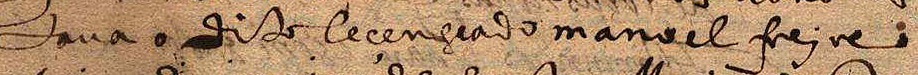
taua o dito lecenseado manoel frejre
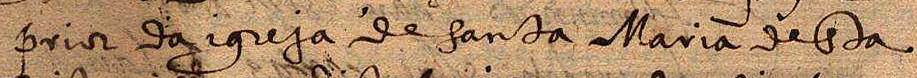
prior da igreja de santa Maria desta
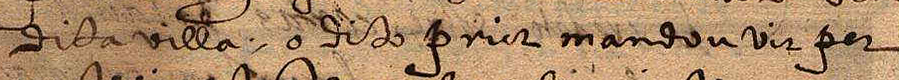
dita villa, o dito prior mandou vir per
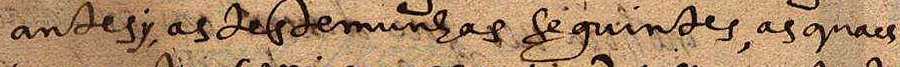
ante sy, as testemunhas seguintes, as quaes
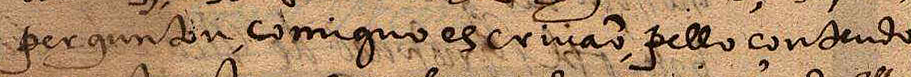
perguntou, comiguo escriuaõ, pello conteudo
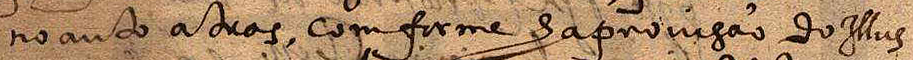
no auto atras, comforme ha prouisaõ do Jllus
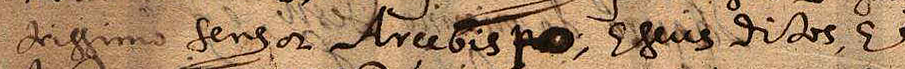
trissimo senhor Arcebispo, E seus ditos, E
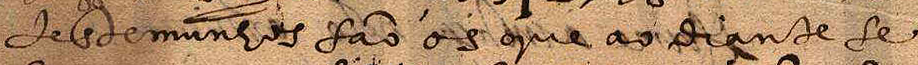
testemunhos são os que ao diante se
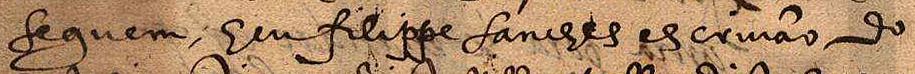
seguem, E eu filippe sanches escriuão do
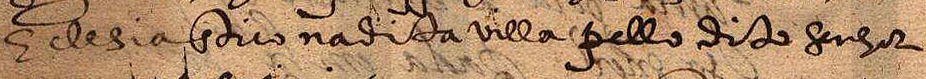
Eclesiastico na dita villa pello dito senhor
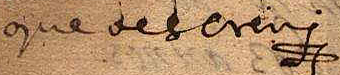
que o escreuj
